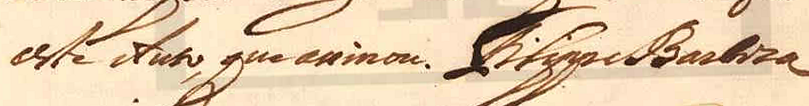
este Auto, que assinou. Filippe Barboza
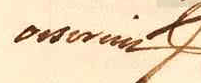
o escreui
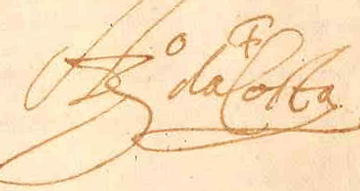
Ago da Costa
